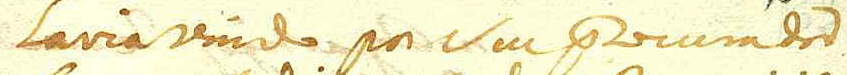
havia vindo por Seu procurador
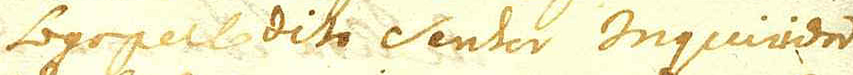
Logo pello dito Senhor Inquizidor
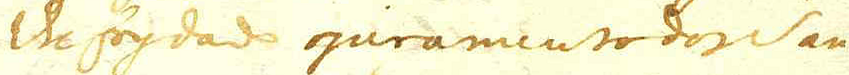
lhe foy dado o juramento dos San
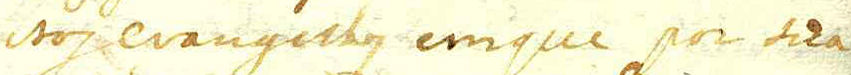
ctos evangelhos em que por sua
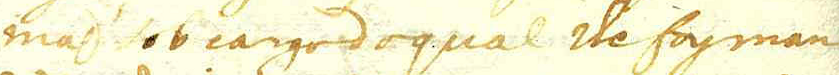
maõ sob cargo do qual lhe foy man
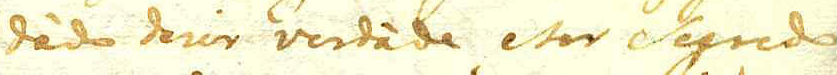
dado dizer verdáde, e ter segredo
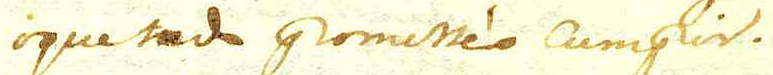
o que tudo promettéo cumprir.
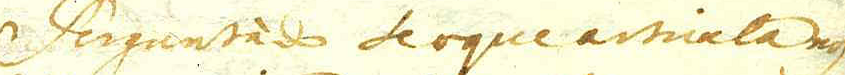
Perguntádo Se o que articula nos
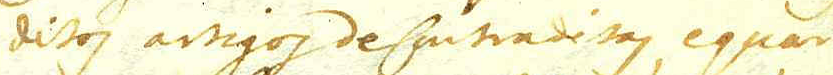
ditos artigos de Contraditas, e quar
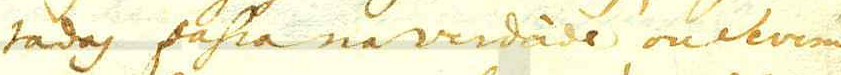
tadas passa na verdáde, ou Se vem
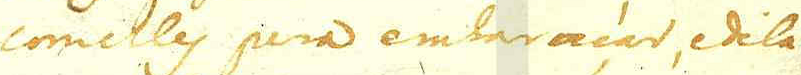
com elles pera embaraçár, e dela
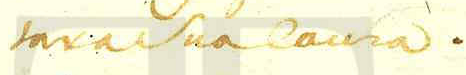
tar a Sua Cauza.
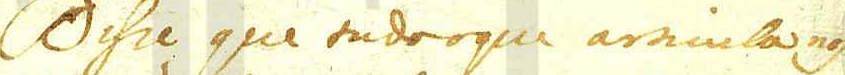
Disse que tudo o que articula nos
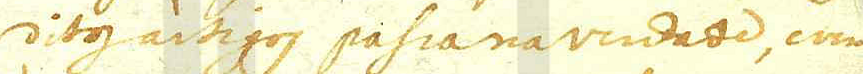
ditos artigos passa na verdade, e vem
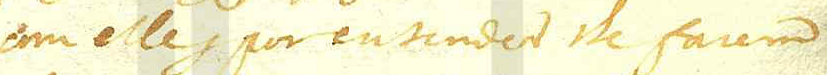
com elles por entender lhe fazem
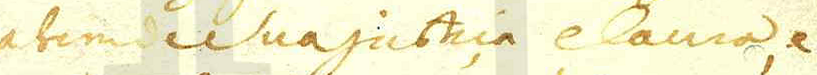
a bem de Sua justiça e Cauza, e
